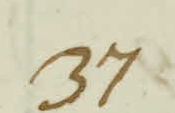37
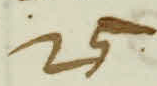25
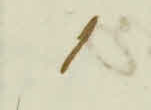1
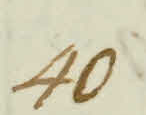40
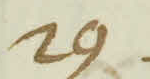29
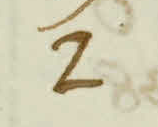2
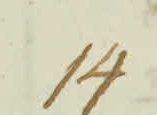14
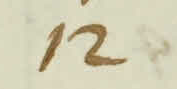12
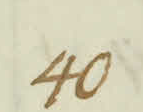40
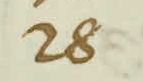28
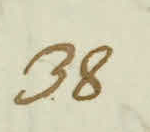38
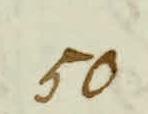50
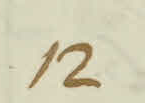12
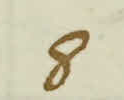8
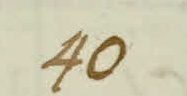40
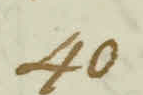40
